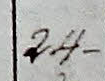24
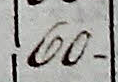60
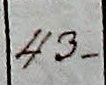43
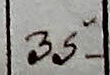35
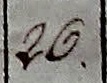26
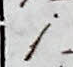1
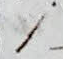1
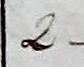2
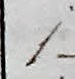1
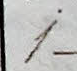1
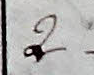2
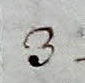3
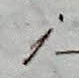1
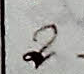2
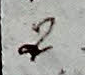2
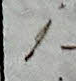1
